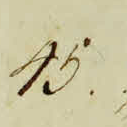45.
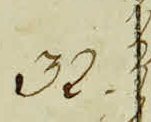32.
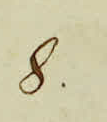8.
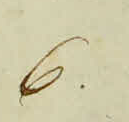6.
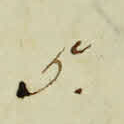5.
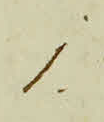1.
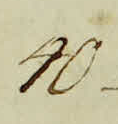40
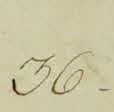36
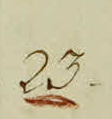23
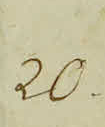20
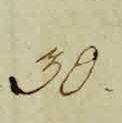30
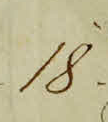18
